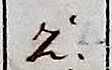2.
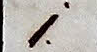1.
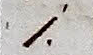1.
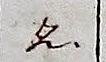2.
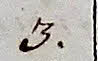3.
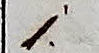1.
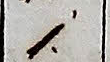1.
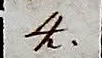4.
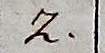2.
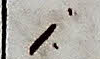1.
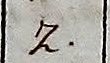2.
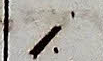1.
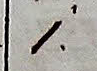1.
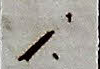1.
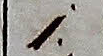1.
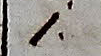1.
